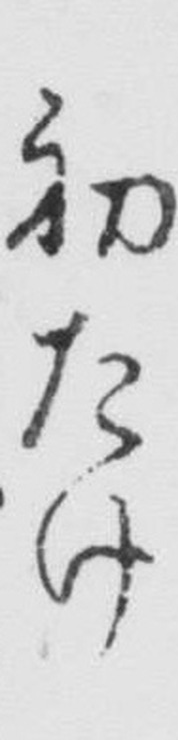初たけ
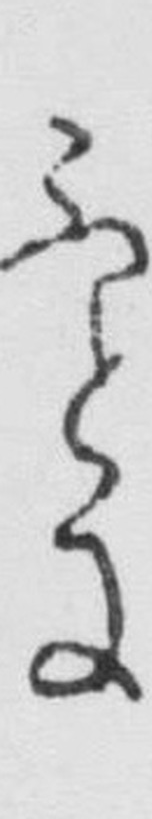ふとに
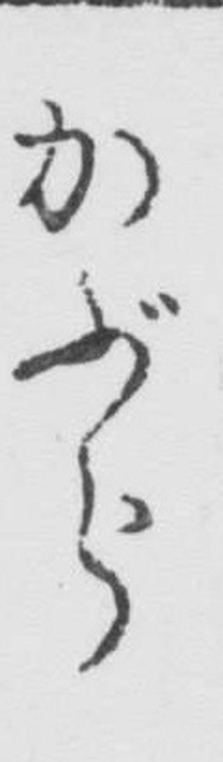かぶら
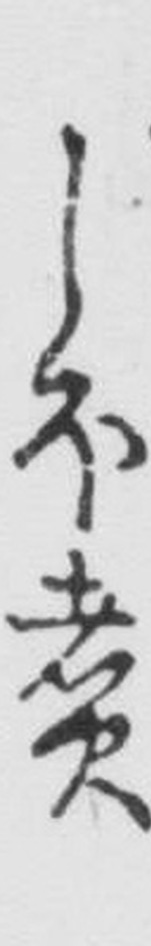しほ煮
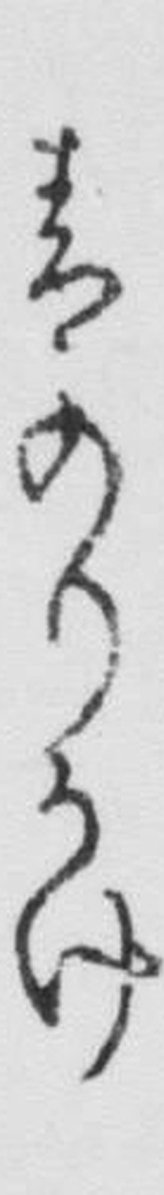青のりかけ
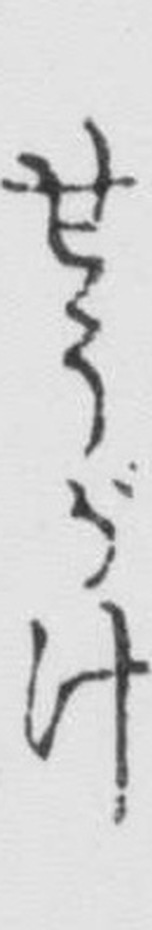せうが汁
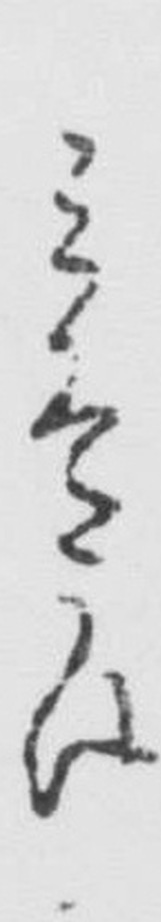みそかけ
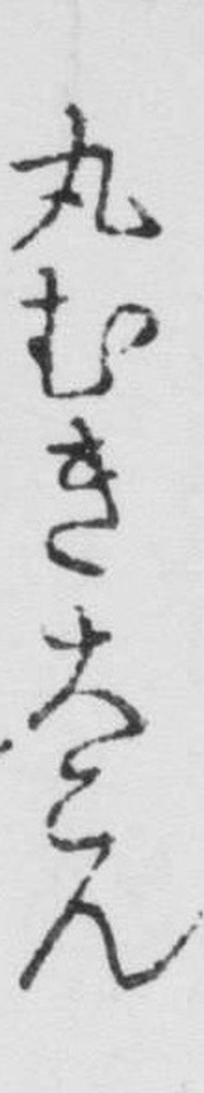丸むき大こん
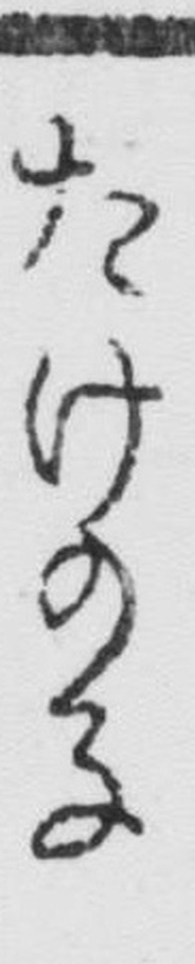たけの子
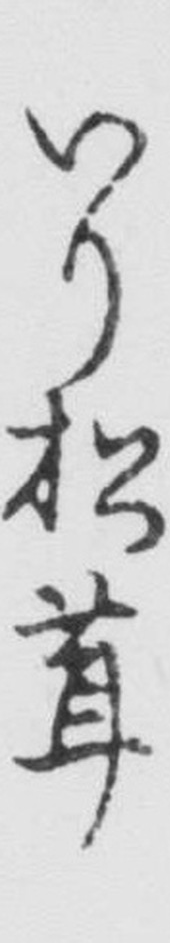いり松茸
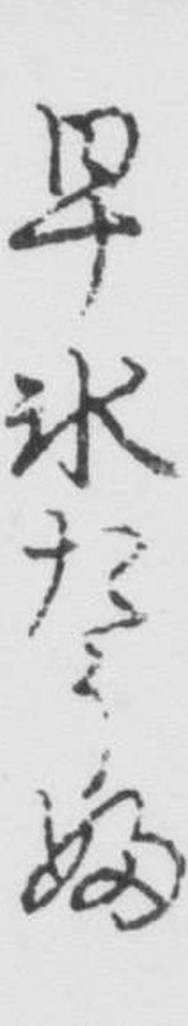早氷たうふ
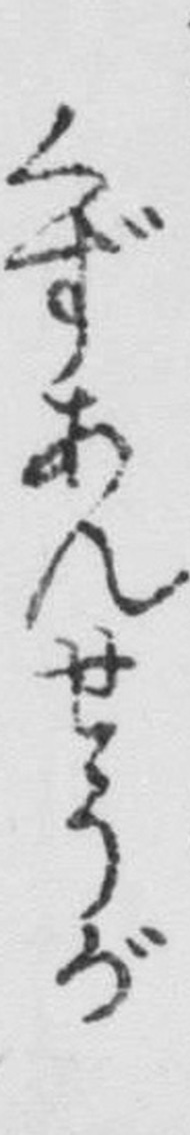くずあんせうが
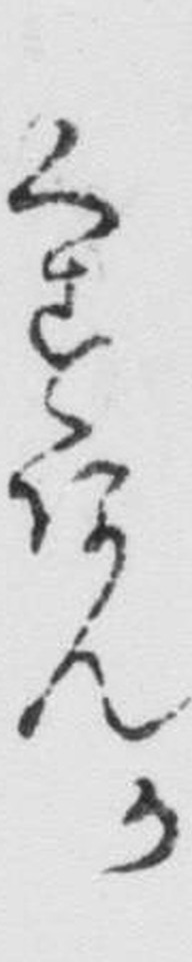くすあんか
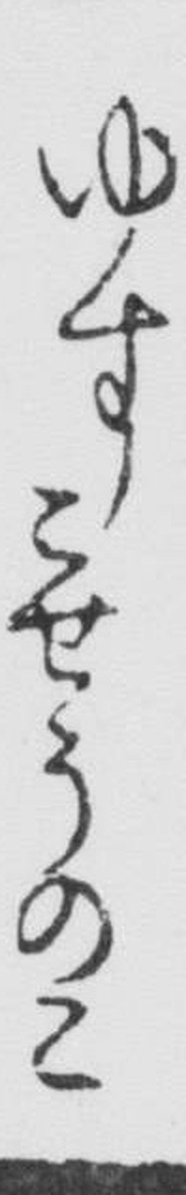ゆすこせうのこ
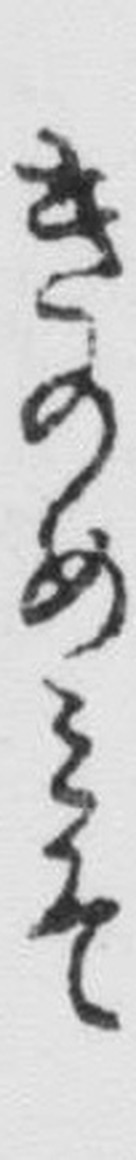きのめみそ
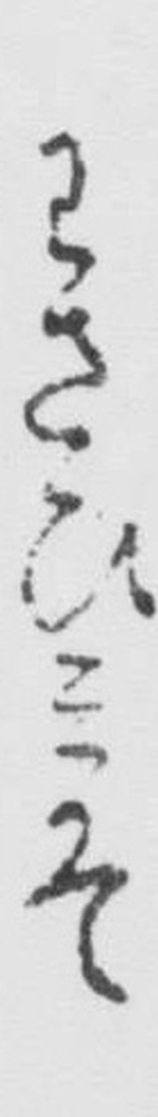わさひみそ
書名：諸家通用/即席料理
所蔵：大阪府立大学学術情報センター 国文学研究資料館
